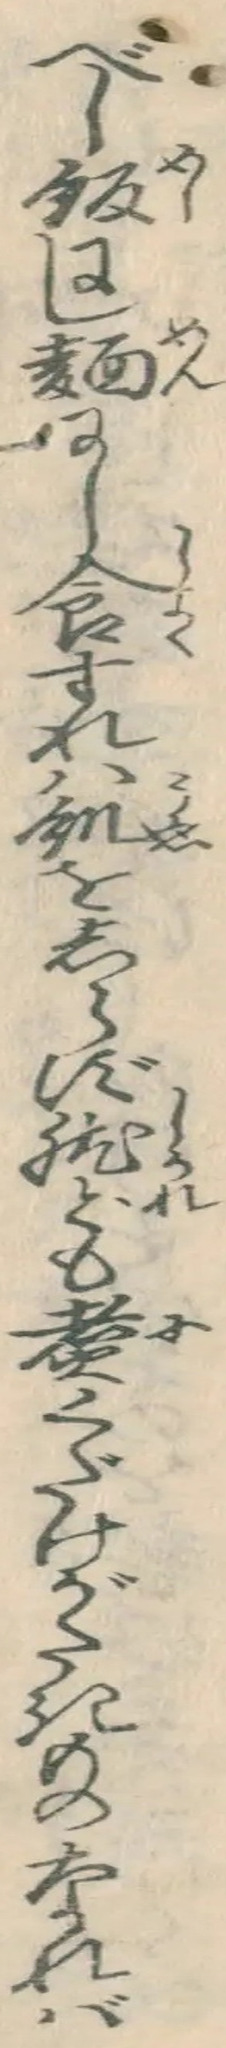べし飯にし麺にし食すれは飢をしらず然ども煑くだけがたきものなれば
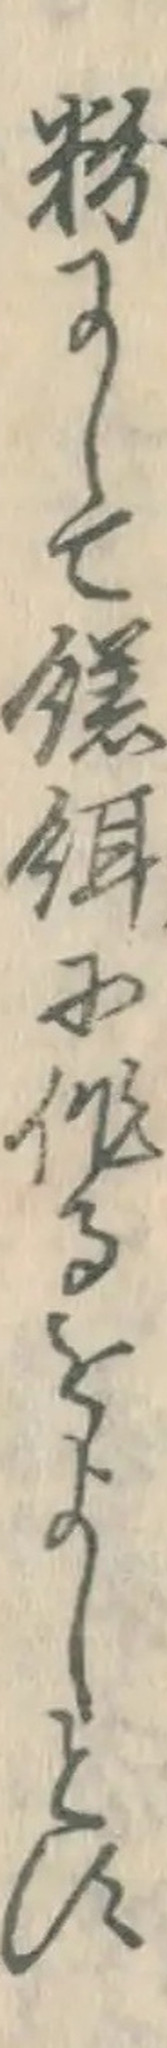粉にして餻餌に作るをよしとす

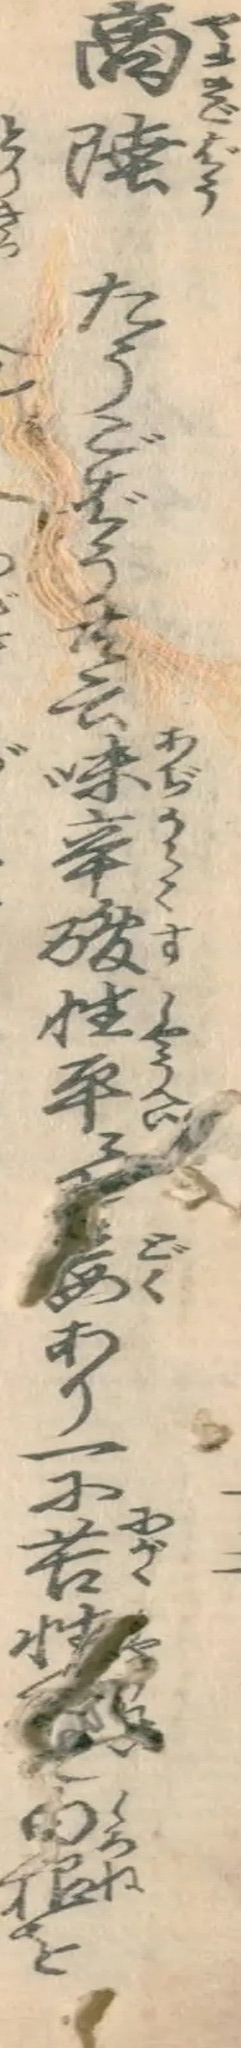商陸たうごばう共云味辛酸性平にて毒あり一に苦性冷也白根を
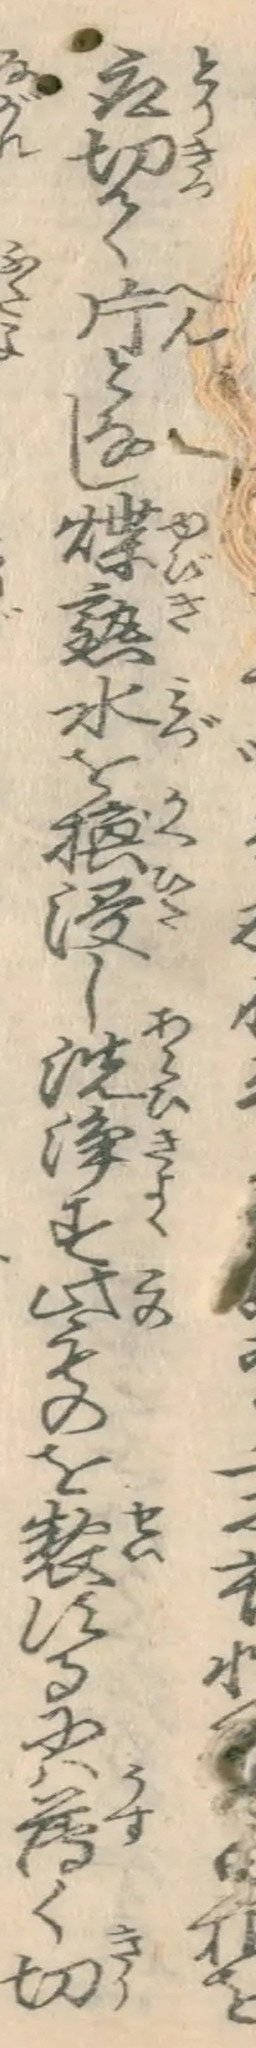取切て片となし煠熟水を換浸し洗淨す此ものを製するには薄く切
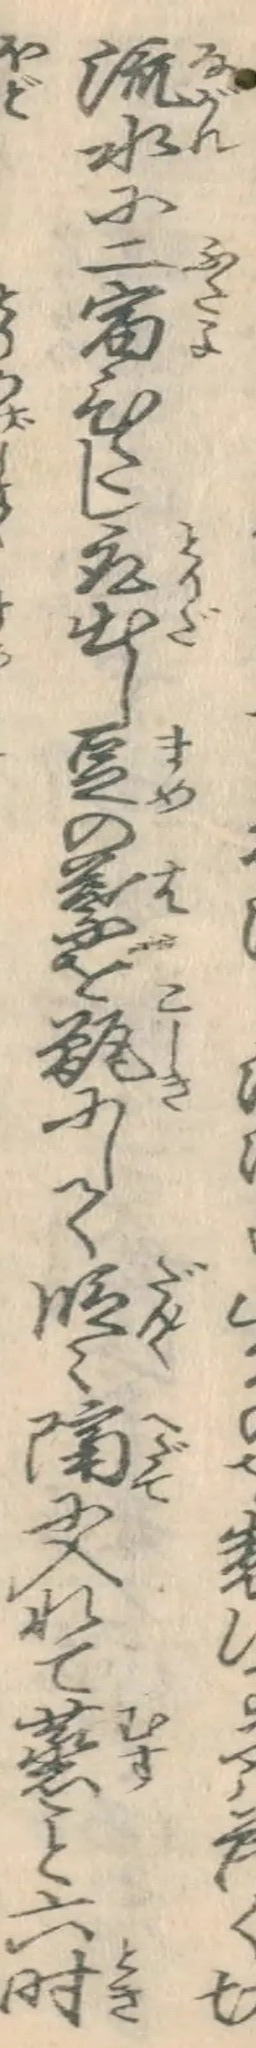流水に二宿ひたし取出し豆の葉を甑にして段々隔に入れて蒸こと六時
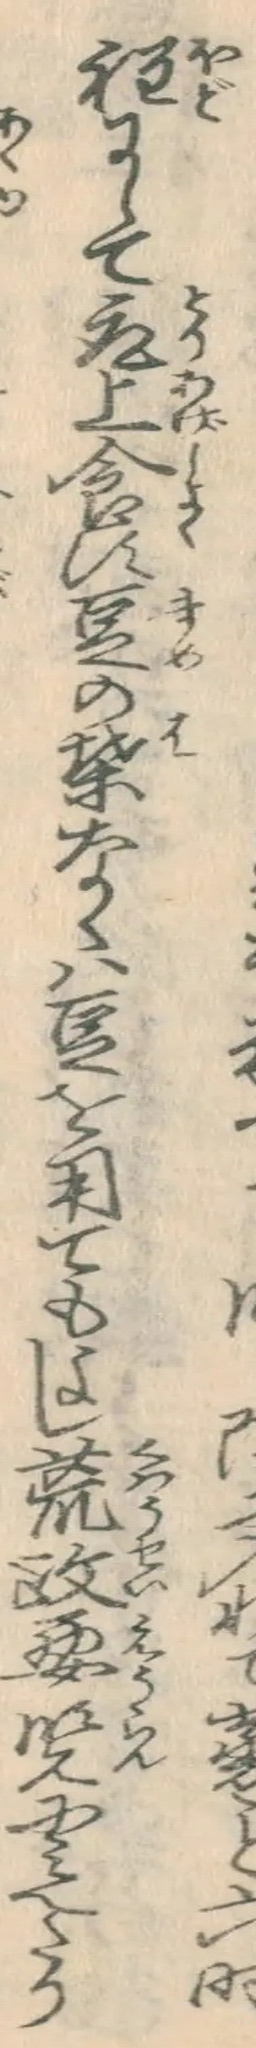程にして取上食す豆の葉なくは豆を用てもよし荒政要覧にみへたり
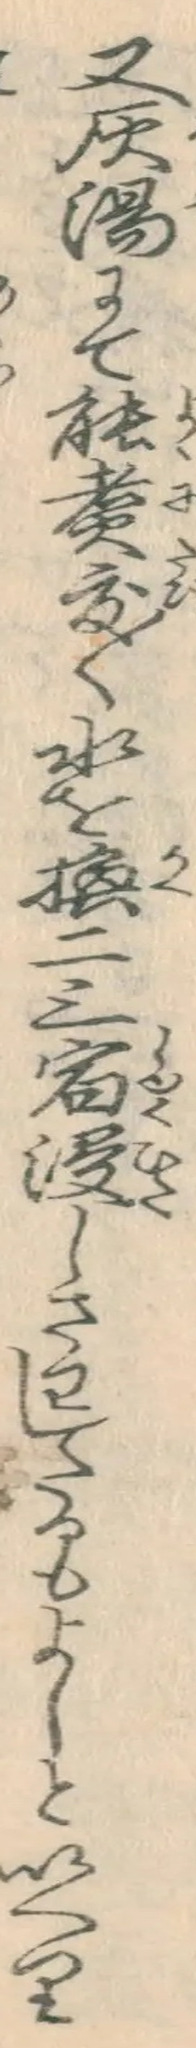又灰湯にて能煑度々水を換二三宿浸しさわしたるもよしといへり
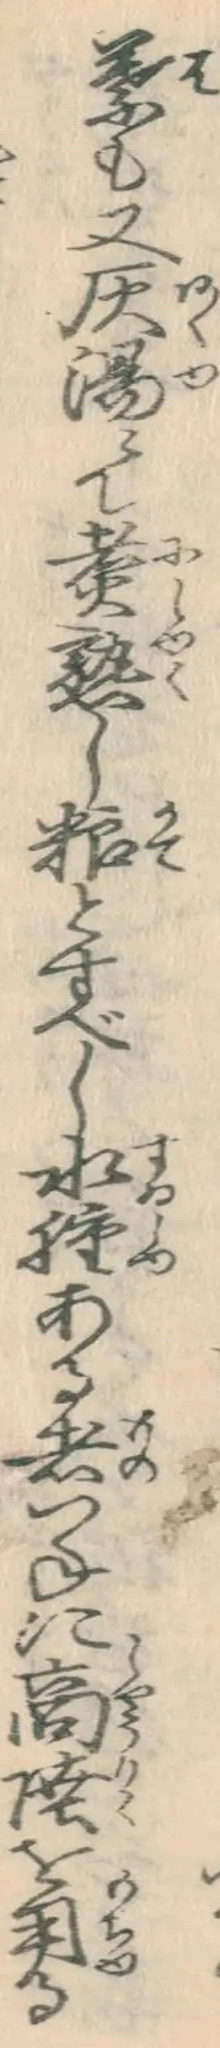葉も又灰湯にて煑熟し粮とすべし水種あるも者つねに商陸を用る
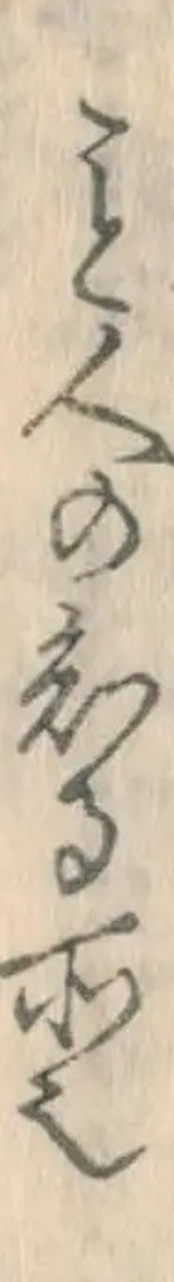こと人の知る所也
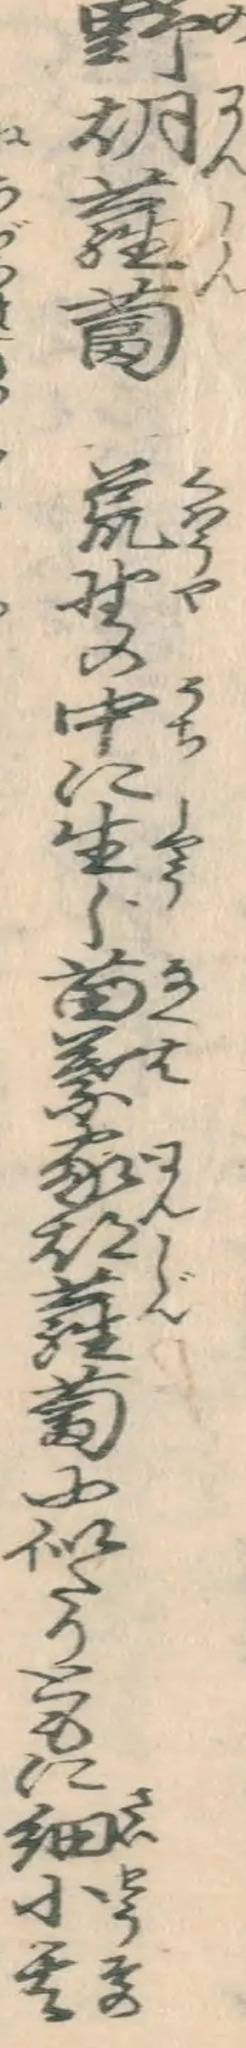野胡薩蔔荒野の中に生じ苗葉家胡薩蔔に似たりともに細小其
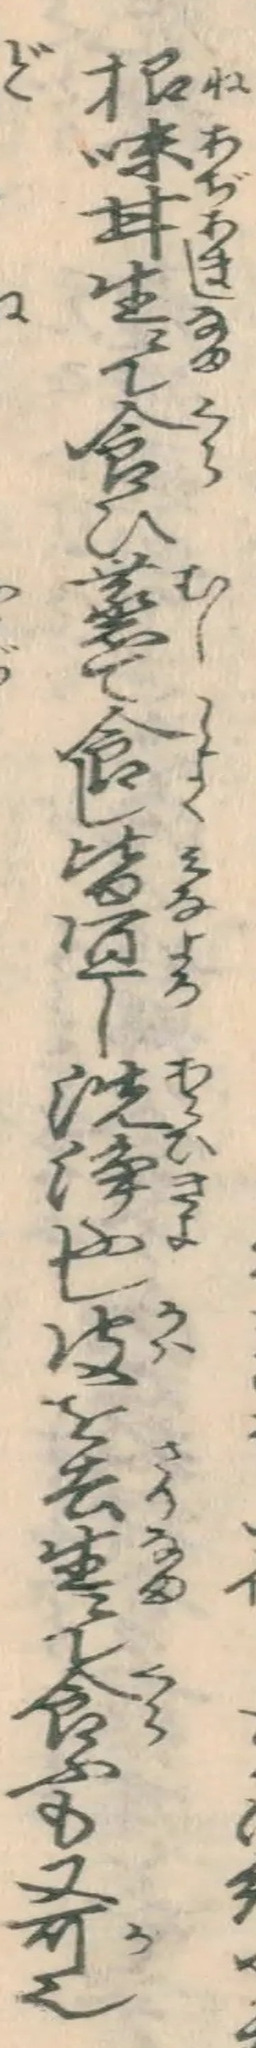根味甘生にて食ひ蒸て食し皆宜し洗浄にし皮を去生にて食ふも又可也
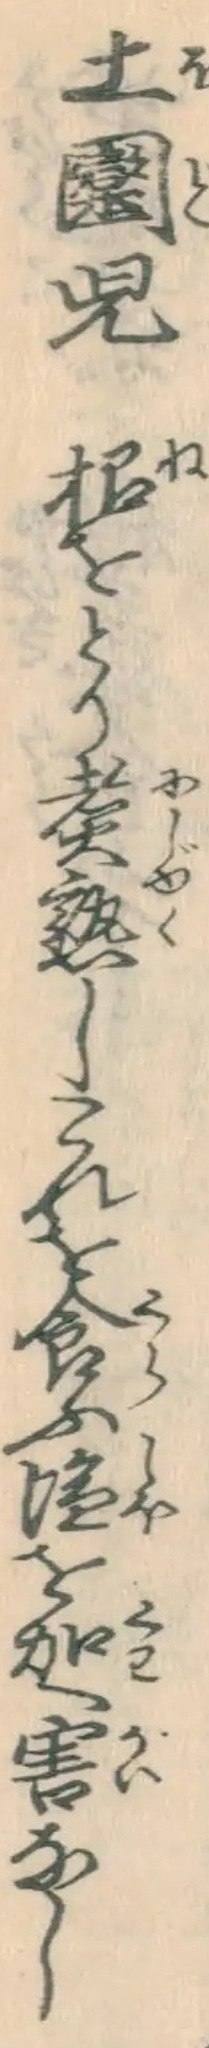土圞児根をとり煑熟しこれを食ふ塩を加へ害なし
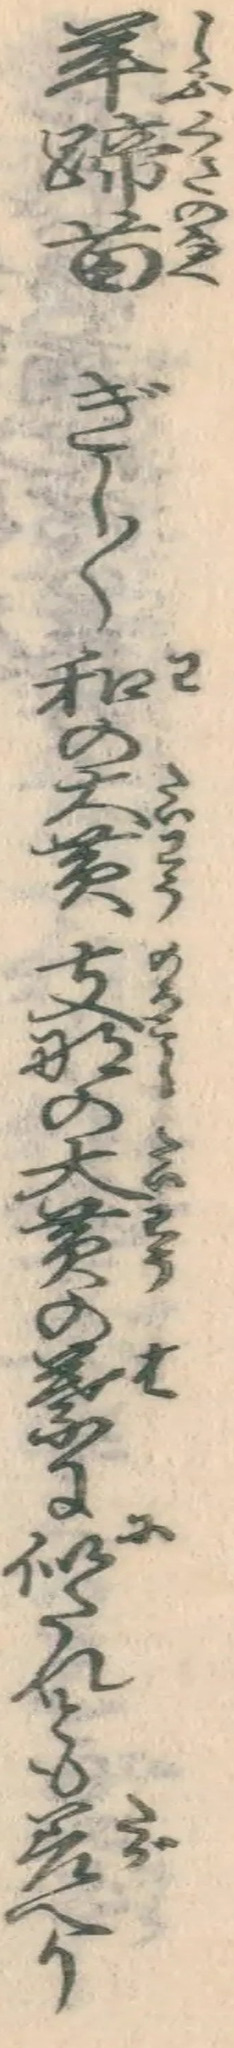羊蹄苗ぎし〳〵和の大黄支那の大黄の葉に似たれとも差へり
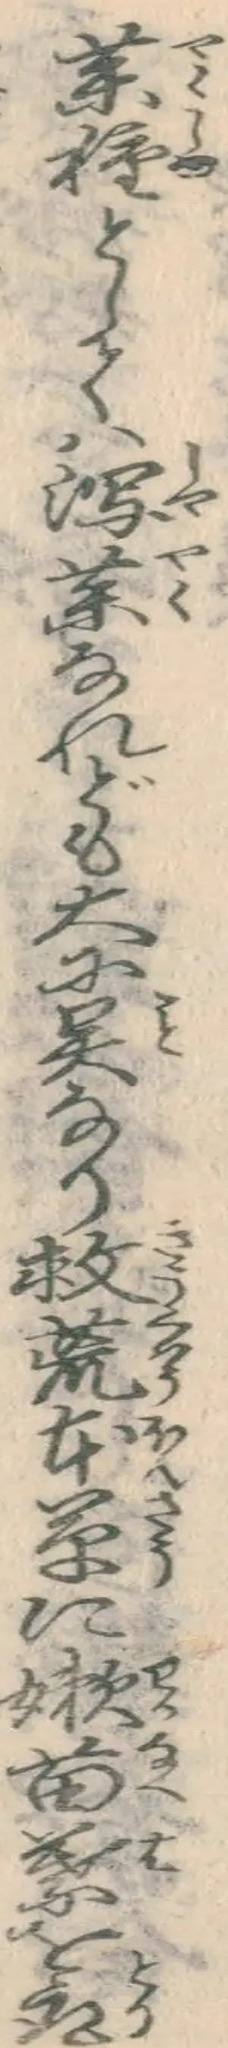薬種としては瀉薬なれども大に異なり救荒本草に嫰苗葉を取
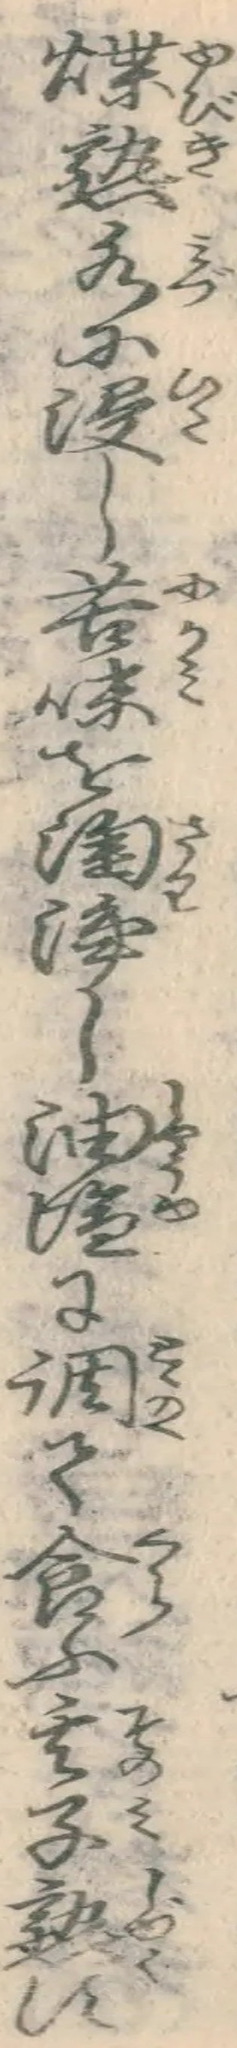煠熟水に浸し苦味を淘浄し油塩に調て食ふ其子熟す
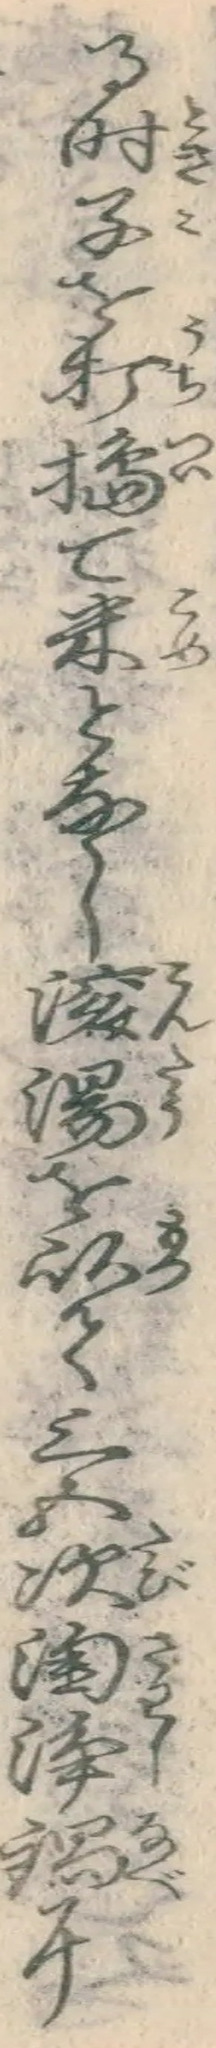る時子を打搗て米となし滾湯を以て三五次淘浄鍋に
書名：経済をしへ草
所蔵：国立国会図書館 National Diet Library, JAPAN
